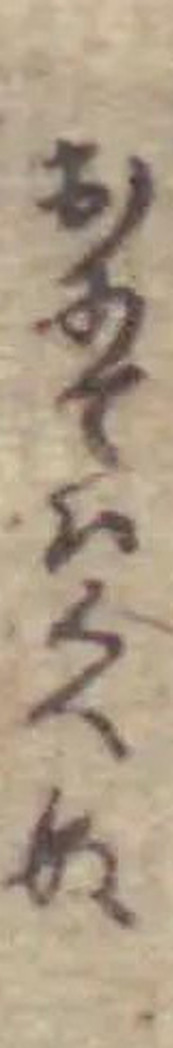おにてはくへぬ
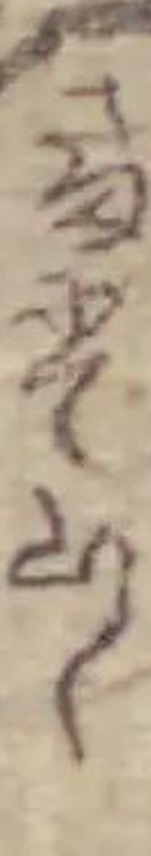さまにて山〳〵
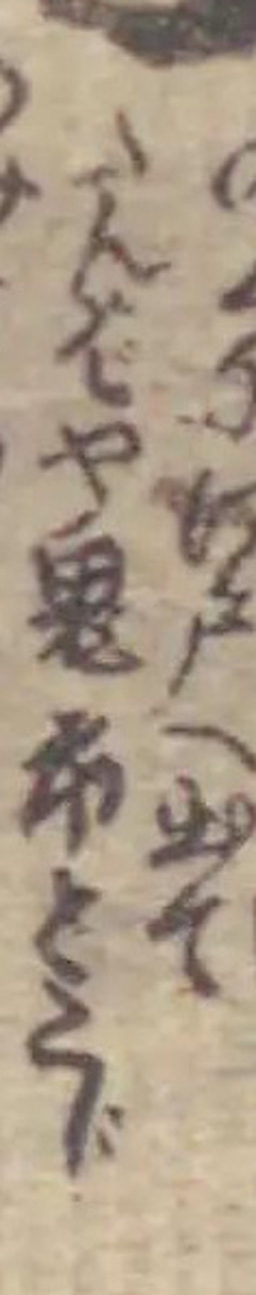たんばや鬼市とこじ
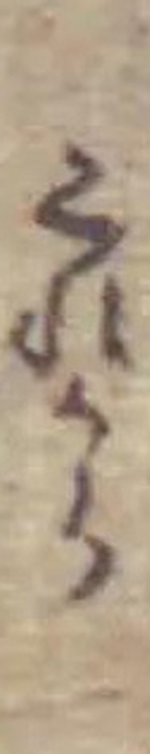これから
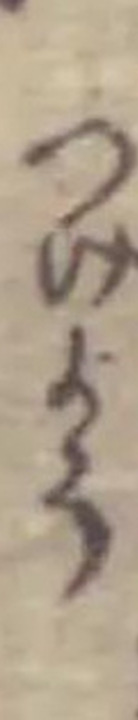つけよう
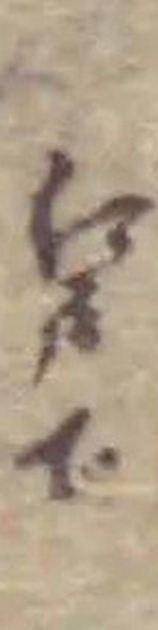江戸で
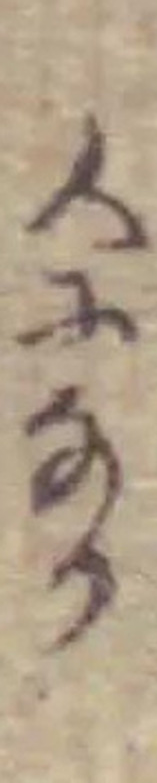人になり
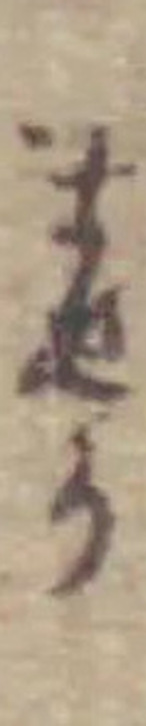ませう
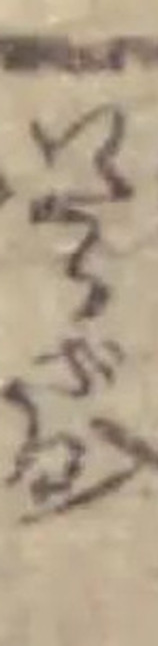いたらざる
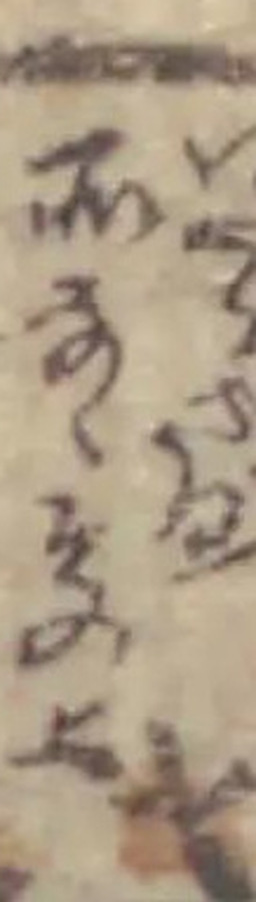所なくその上
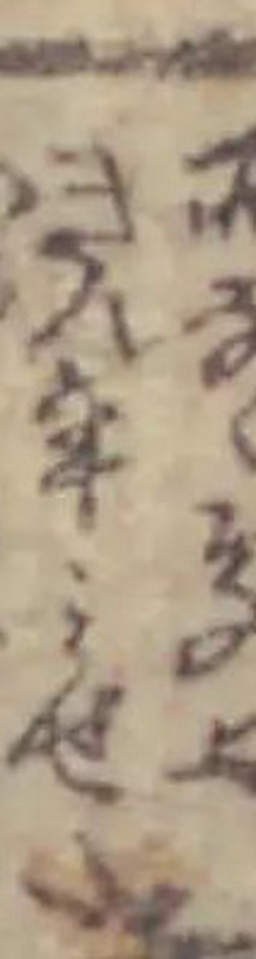きん年みせ
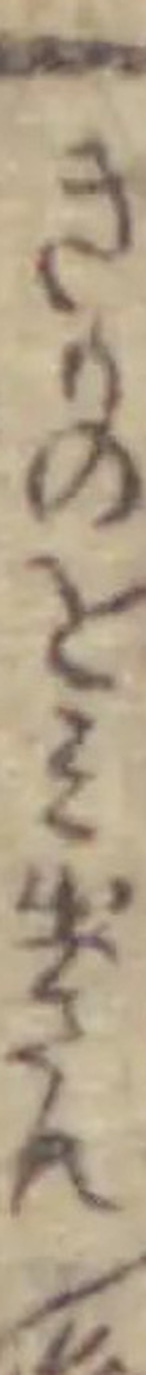きものをみ出さん
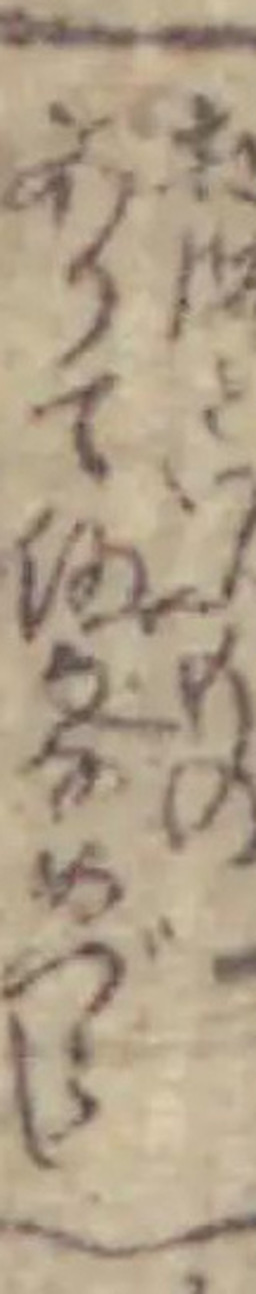ありて何かなめづらし
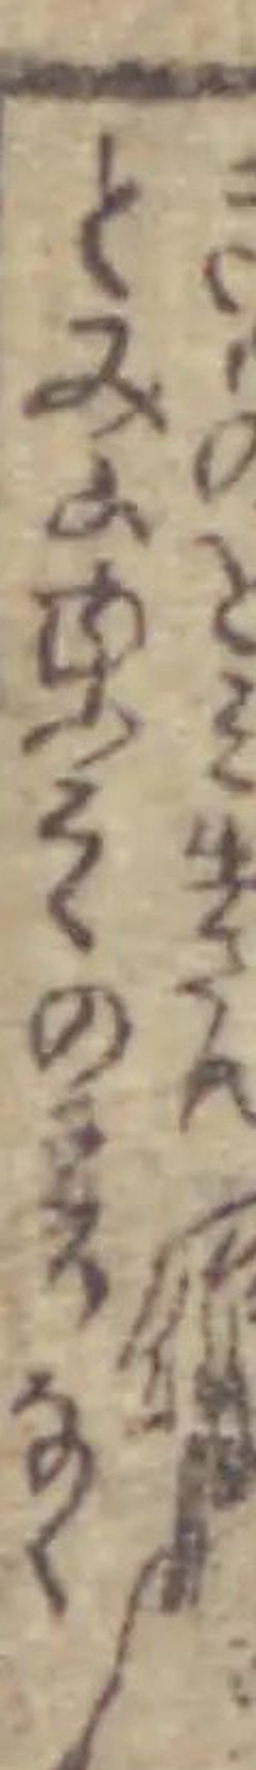とみ山ゆふこくのころなく
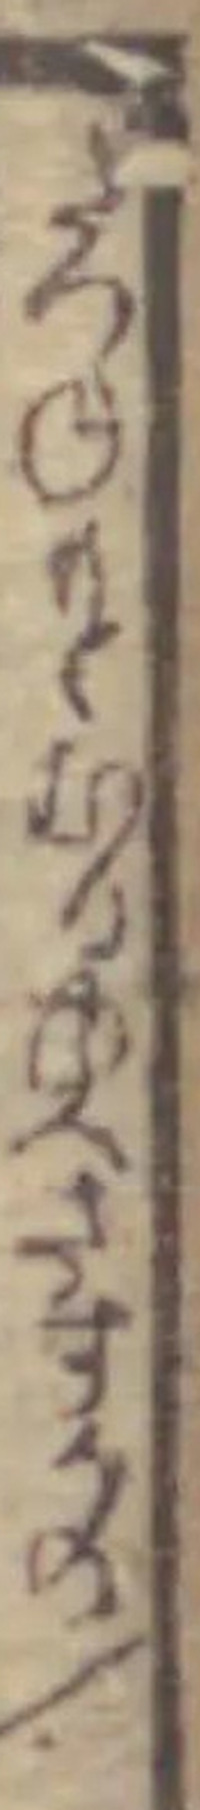たつねもとむるゆへさすかの
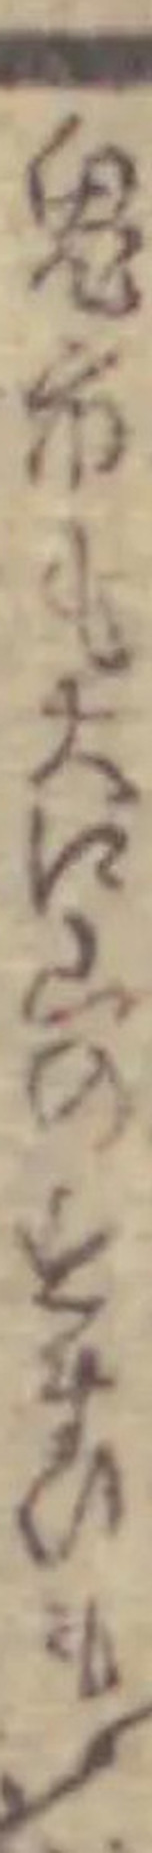鬼市も大江山のすまひも
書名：鬼子宝 3巻
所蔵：国立国会図書館 National Diet Library, JAPAN
